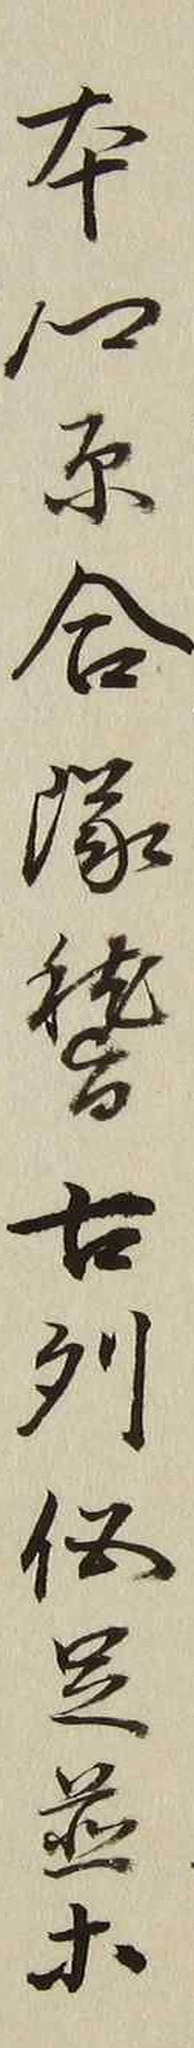本郷合隊稽古列伍足並等
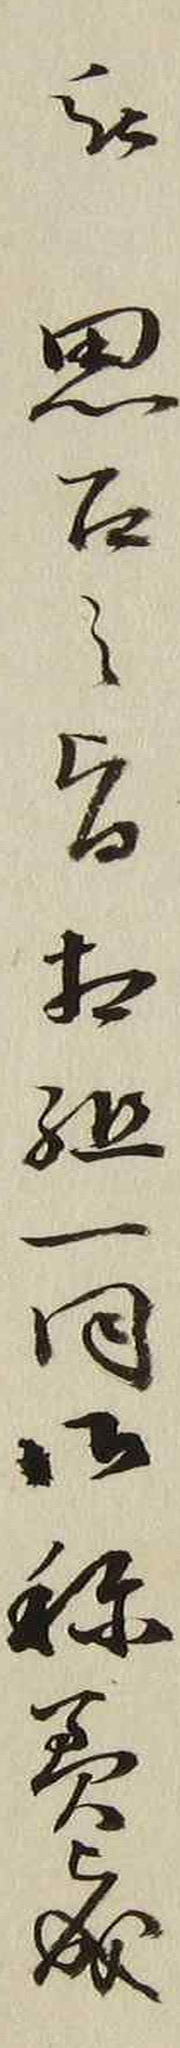思召され候旨相組一同御称美成し
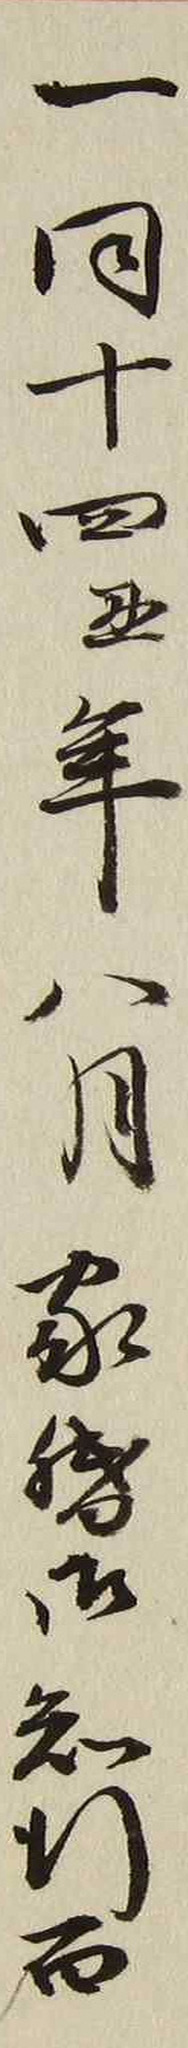一同十四丑年八月家督御知行百
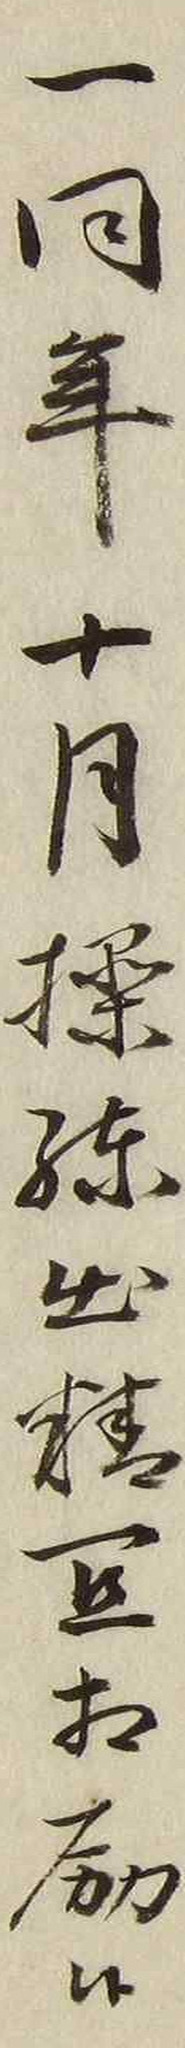一同年十月探練出精宜しく相勤め候

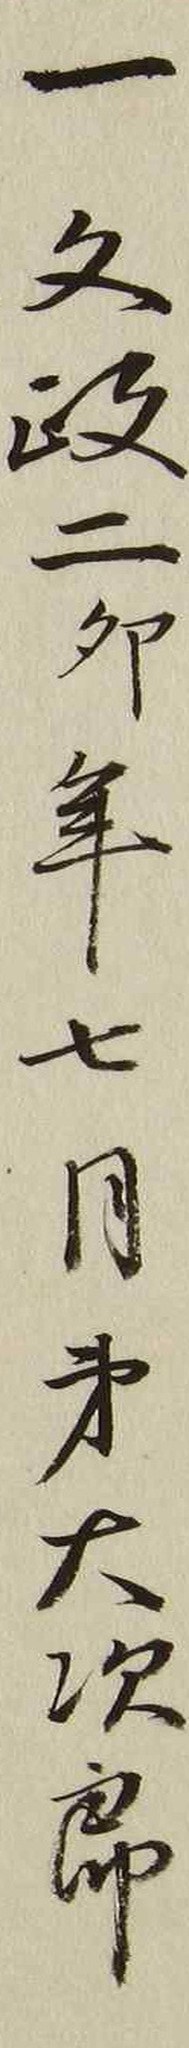一文政二卯年七月弟大次郎
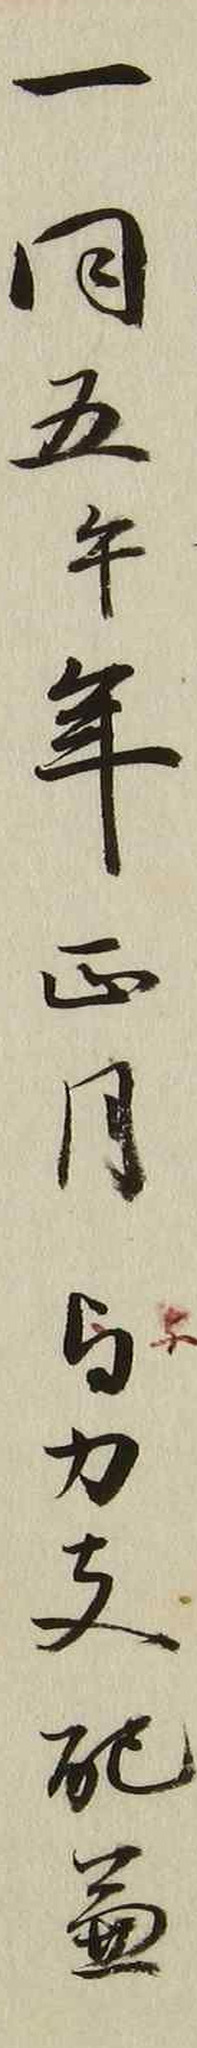一同五午年正月与力支配兼
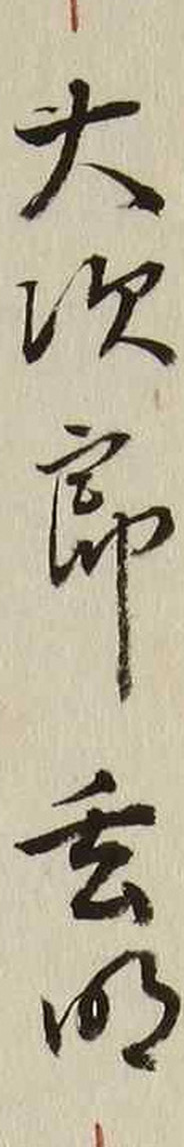大次郎玄明
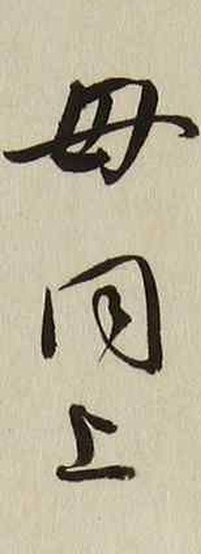母同上
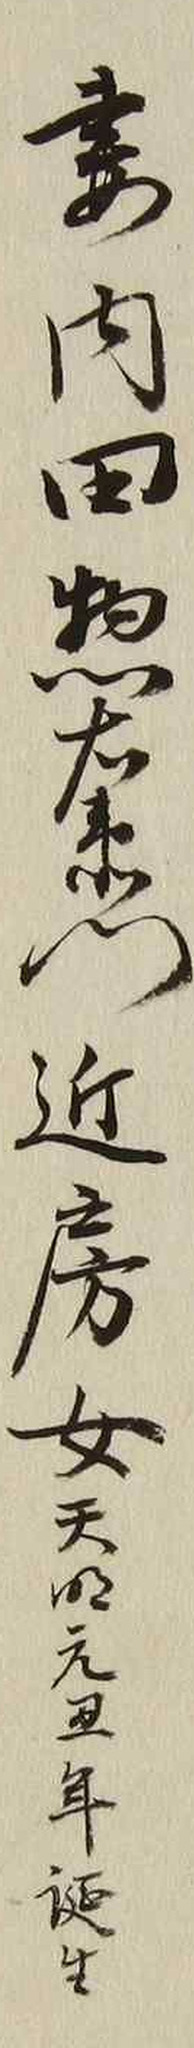妻内田惣右衛門近房女天明元丑年誕生
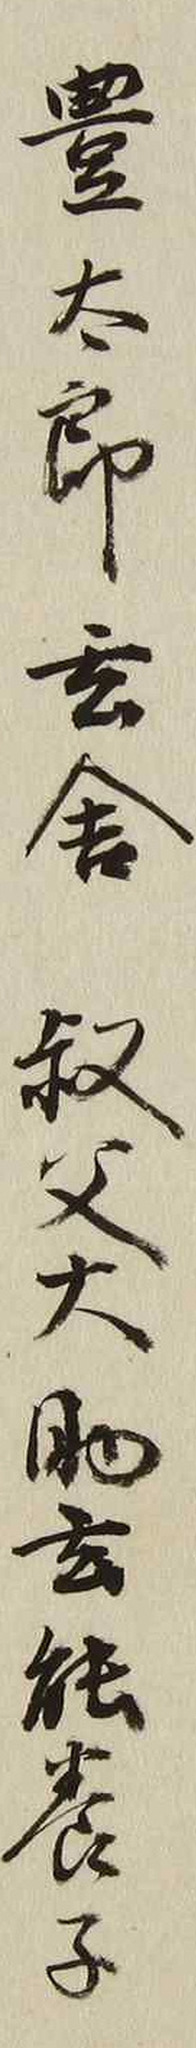豊太郎玄舎叔父大助け玄能養子
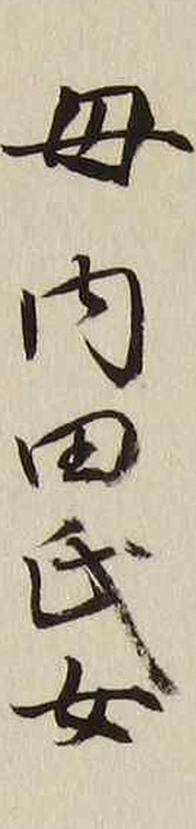母内田氏女

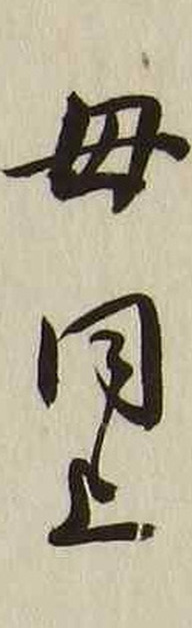母同上
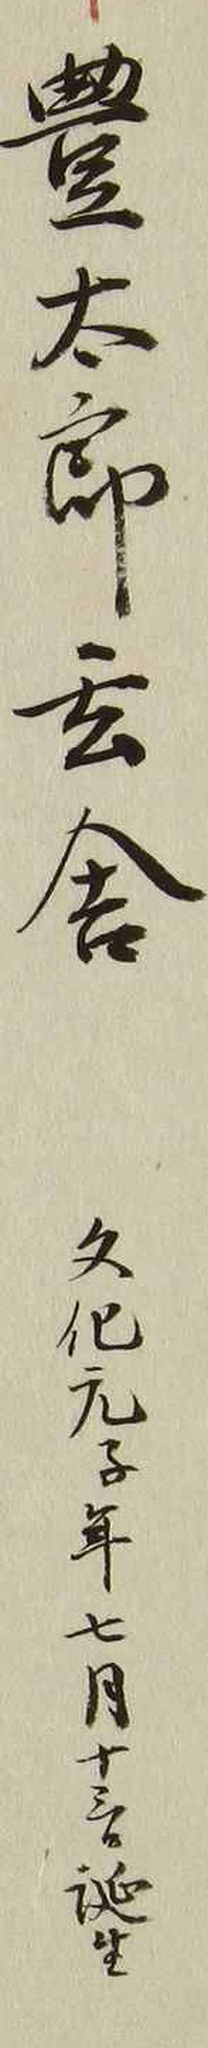豊太郎玄舎文化元子年七月十三日誕生
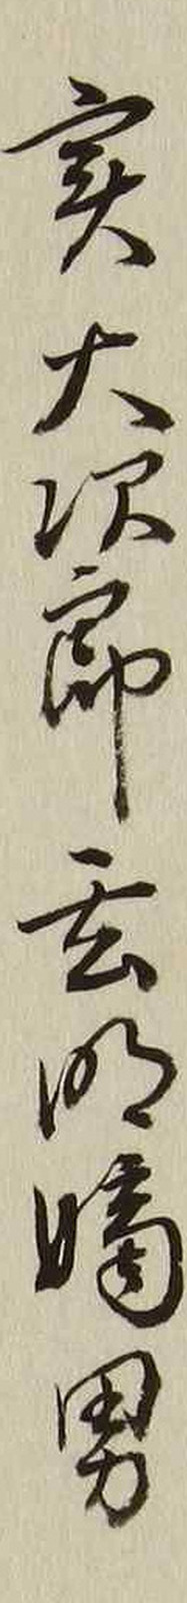実大次郎玄明嫡男
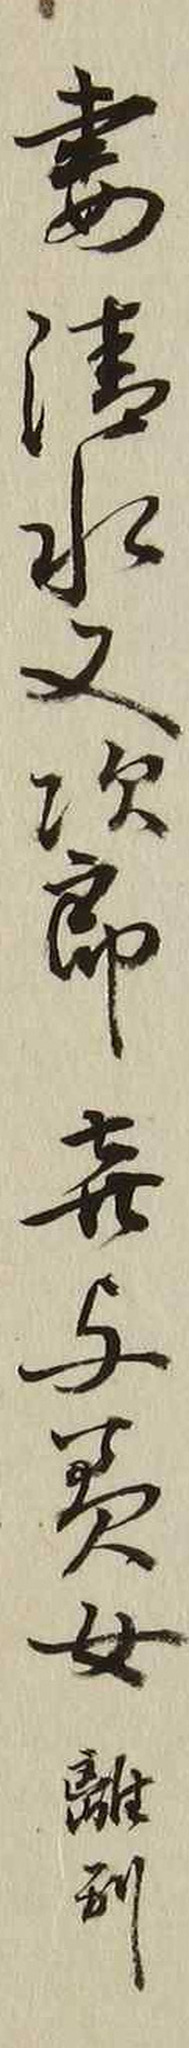妻清水又次郎喜与美女離別
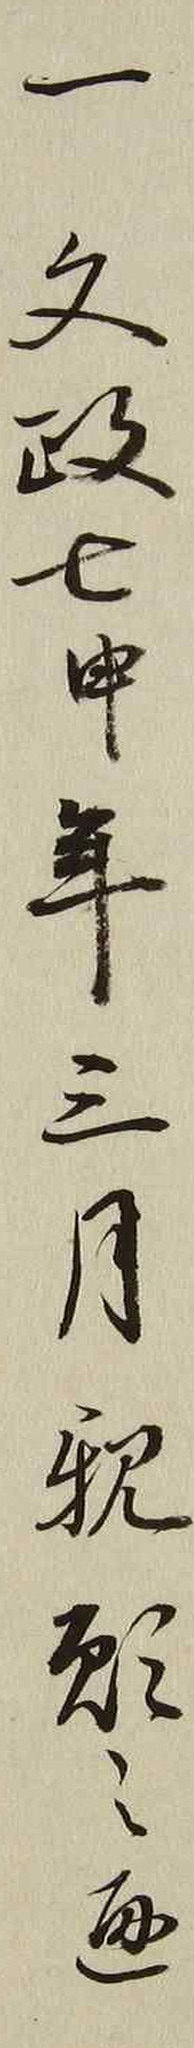一文政七申年三月親願い之通
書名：諸士系譜　巻之19　い之部19
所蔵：会津若松市立会津図書館
